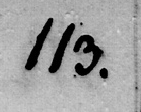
19.
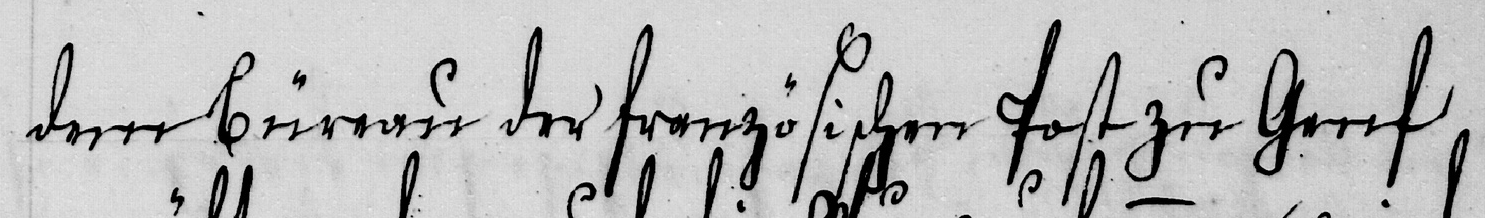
dem Büreau der französischen Post zu Genf
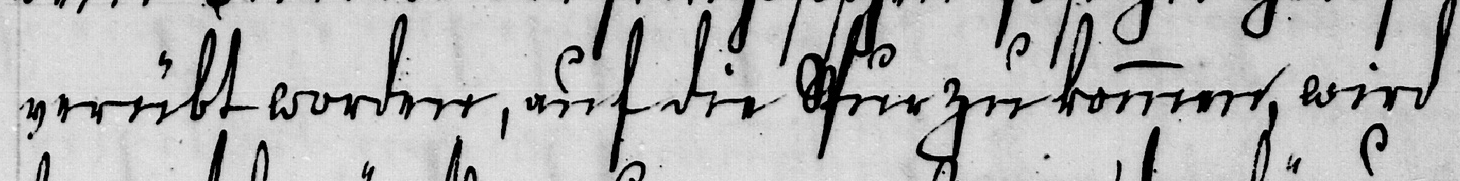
verübt worden, auf die Spur zu kommen, wird
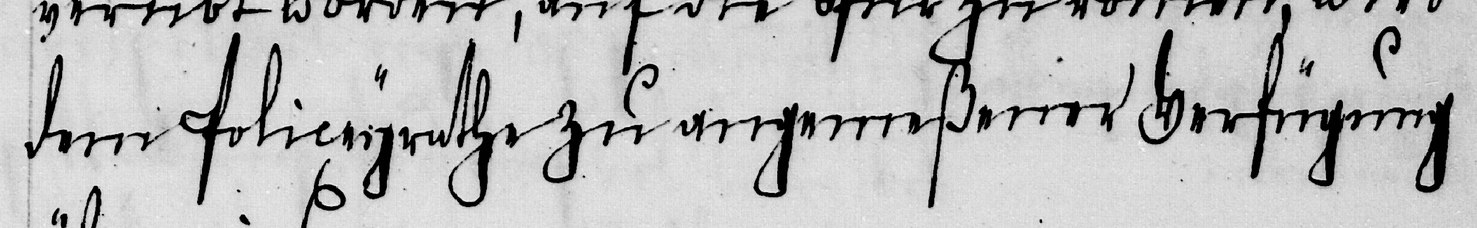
dem Policeyrathe zu angemeßener Verfügung
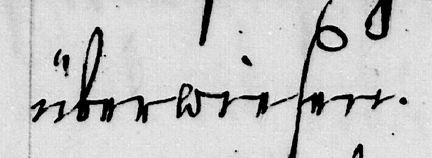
überwiesen.
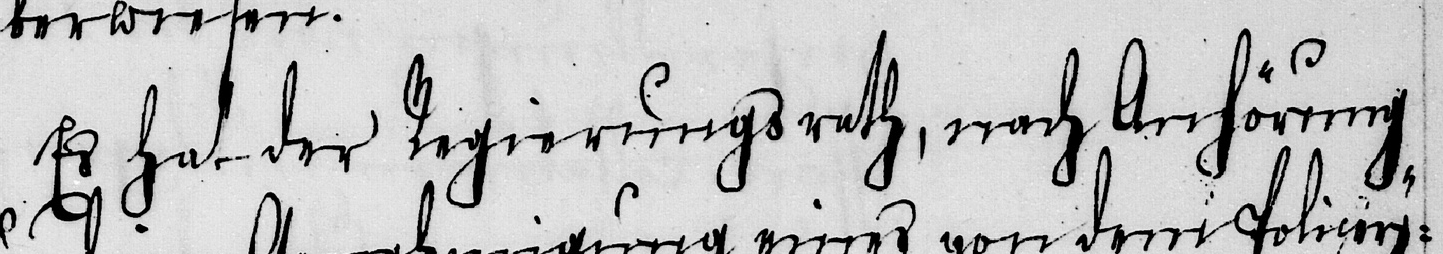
Es hat der Regierungsrath, nach Anhörung
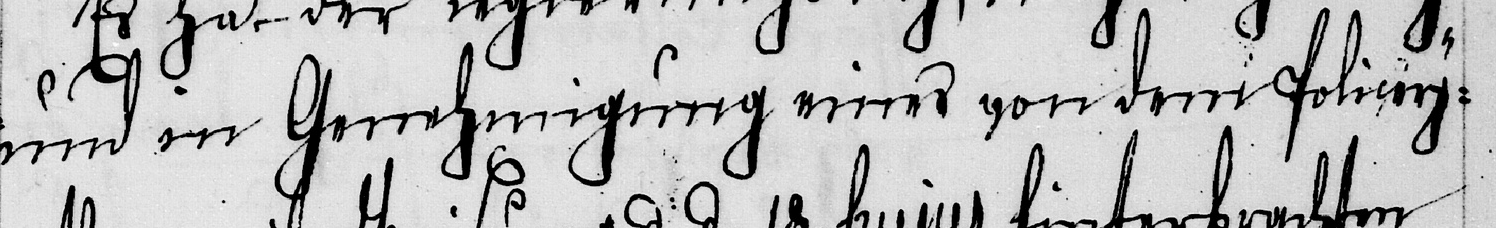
und Genehmigung eines von dem Policey¬
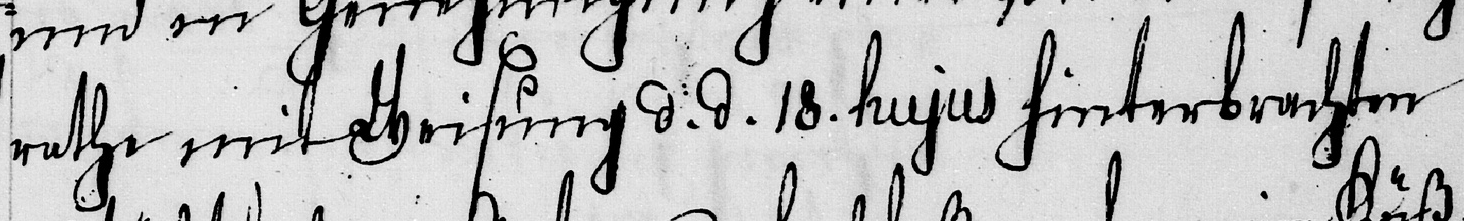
rathe mit Weisung d. d. 18. hujus hinterbrachten
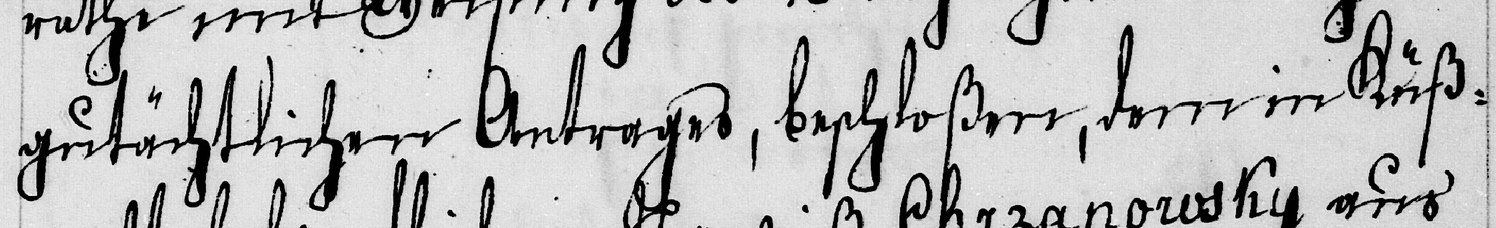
gutächtlichen Antrages, beschloßen, dem in Küß¬
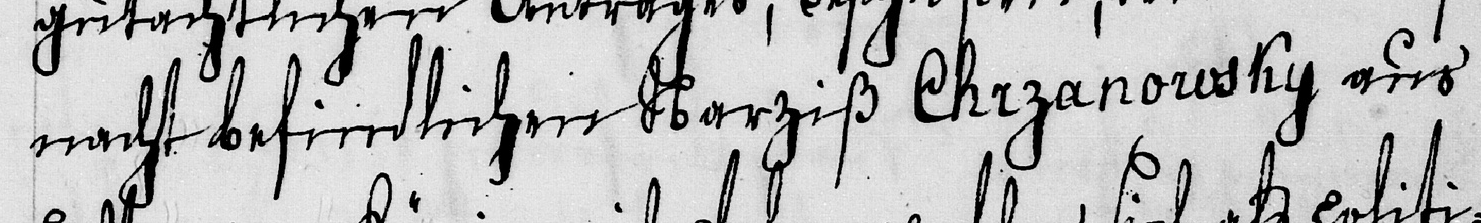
nacht befindlichen Narziß Chrzanowsky aus
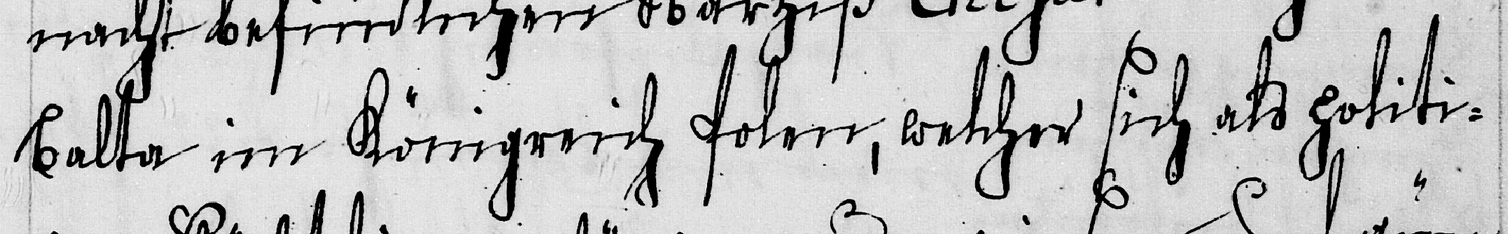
Balta im Königreich Polen, welcher sich als politi¬
